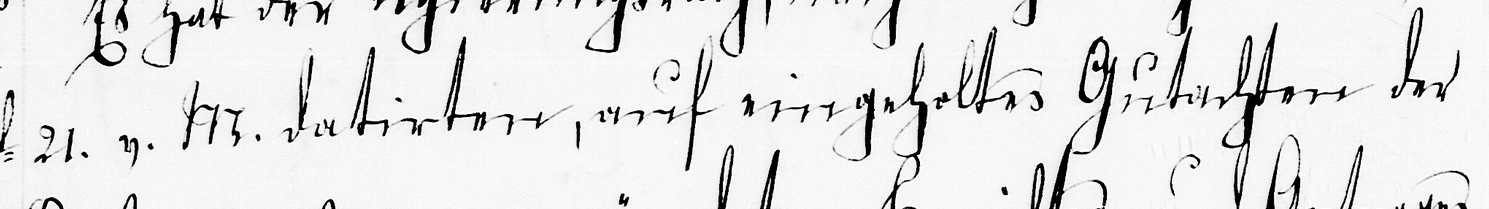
21. v. M. datirten, auf eingeholtes Gutachten der
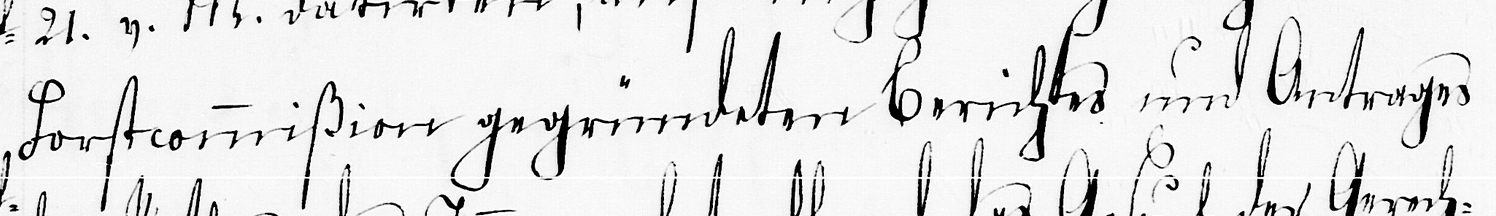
Forstcommißion gegründeten Berichtes und Antrages
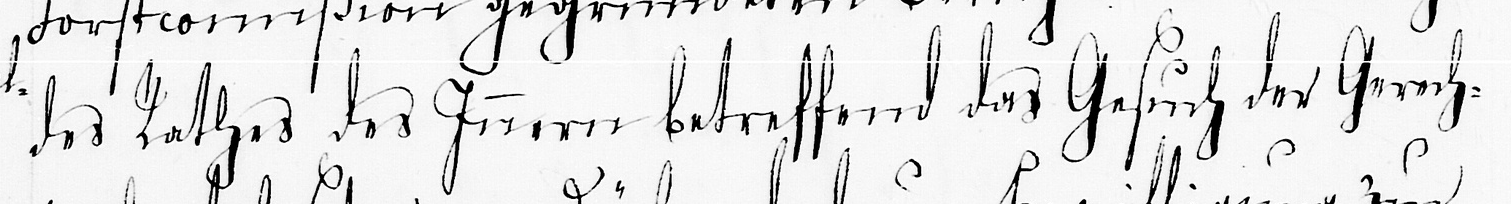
des Rathes des Innern betreffend das Gesuch der Gerech¬
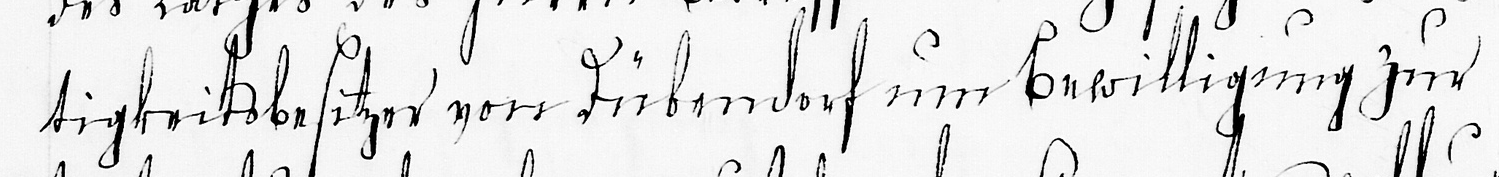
tigkeitsbesitzer von Dübendorf um Bewilligung zur
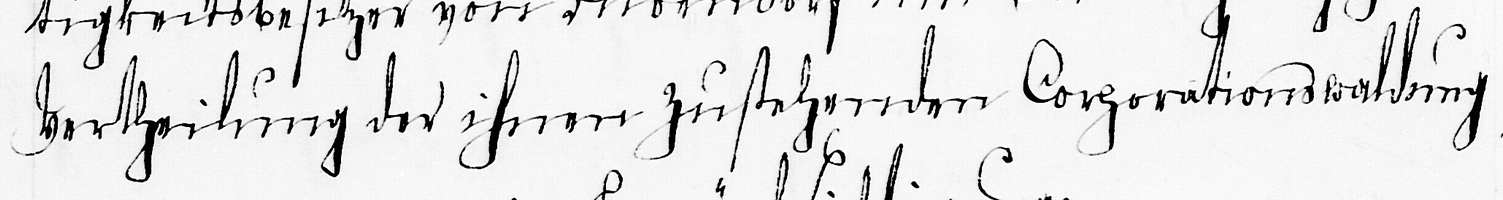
Vertheilung der ihnen zustehenden Corporationswaldung
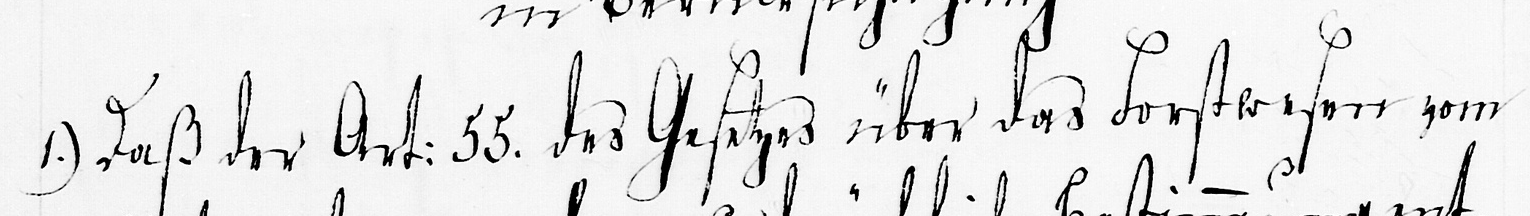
1.) Daß der Art: 55. des Gesetzes über das Forstwesen vom
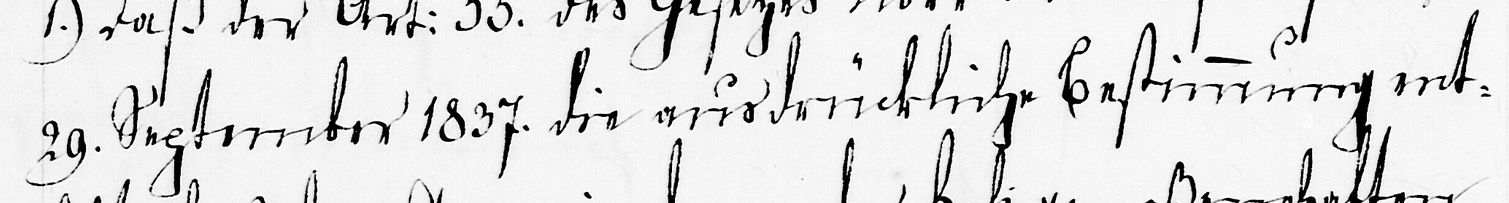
29. September 1837. die ausdrückliche Bestimmung ent¬
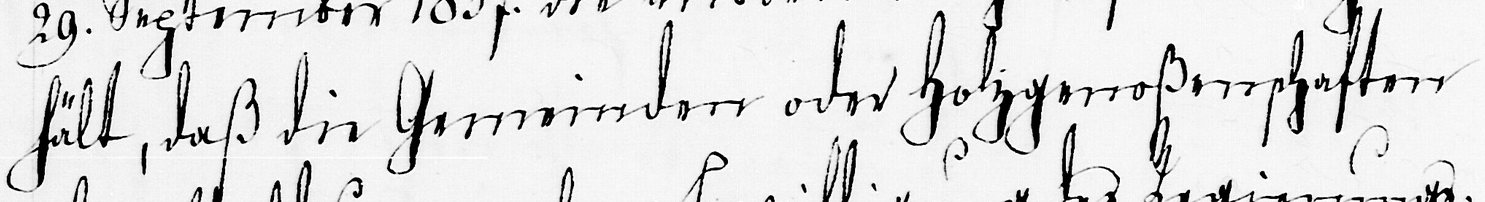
hält, daß die Gemeinden oder Holzgenoßenschaften
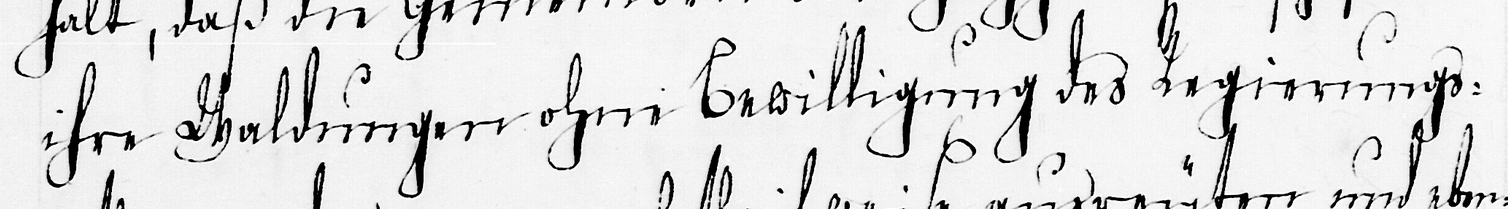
ihre Waldungen ohne Bewilligung des Regierungs¬
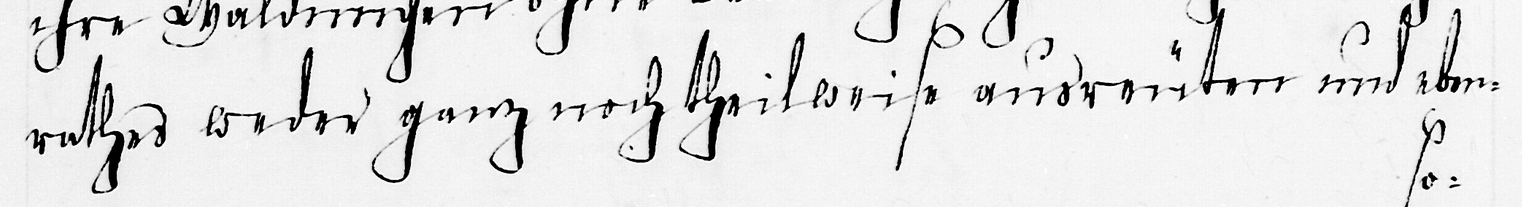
rathes weder ganz noch theilweise ausreuten und eben-
